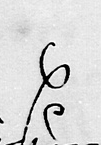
s¬
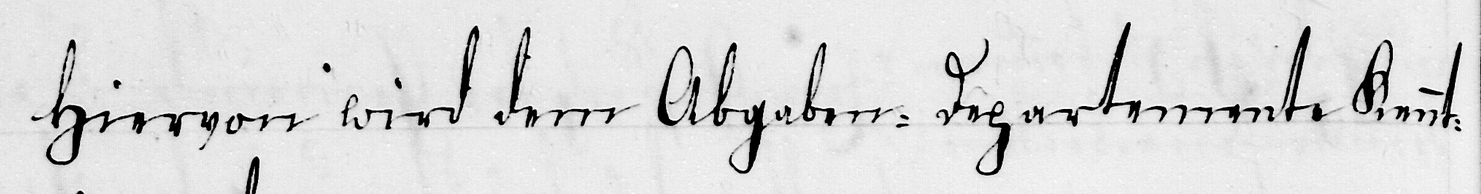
Hiervon wird dem Abgaben-Departemente Kenn¬
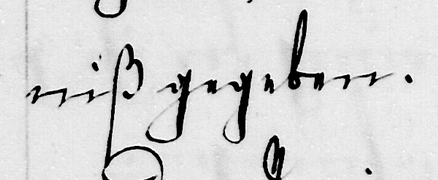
tniß gegeben.
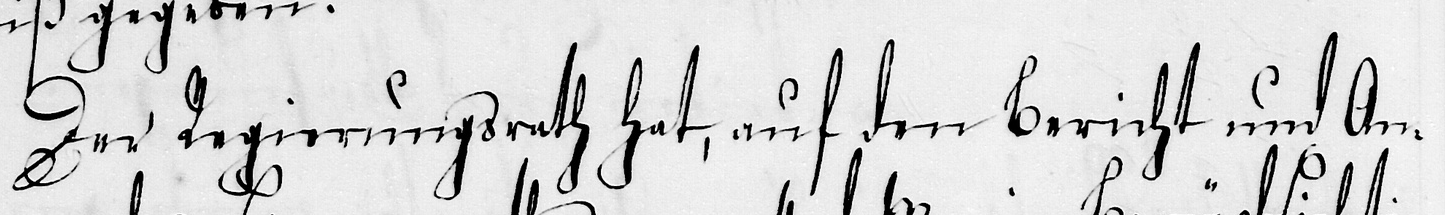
Der Regierungsrath hat, auf den Bericht und An¬
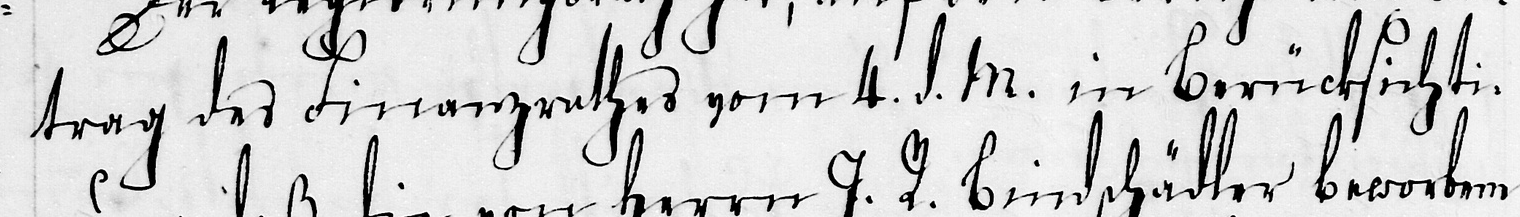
trag des Finanzrathes vom 4. d. M. in Berücksichti¬
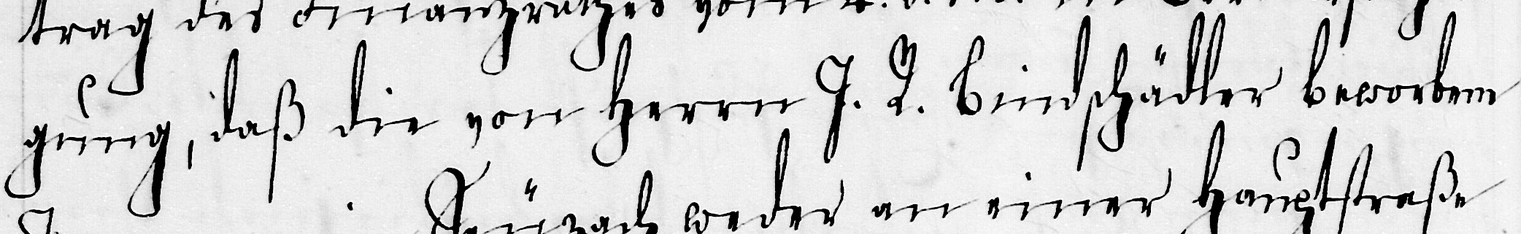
gung, daß die von Herrn J.R. Bindschädler beworbene
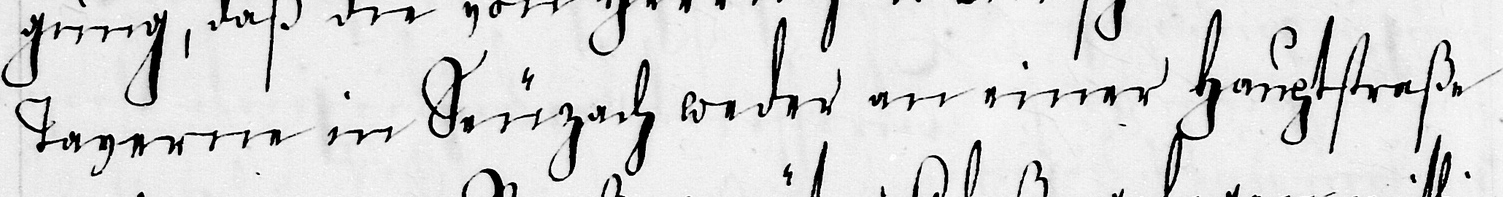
Taverne in Seuzach weder an einer Hauptstraße
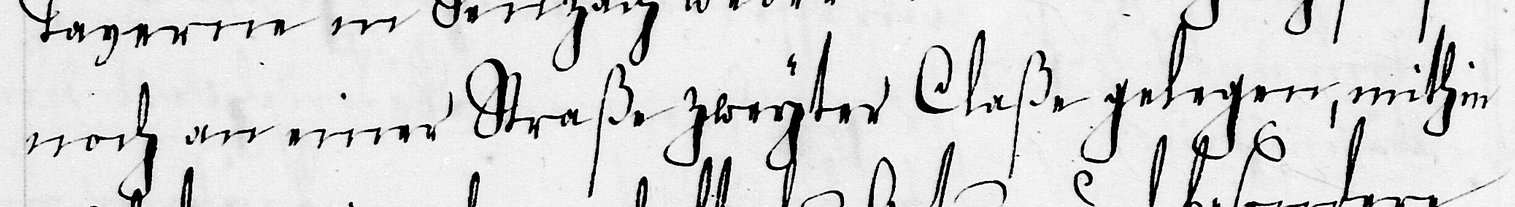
noch an einer Straße zweyter Claße gelegen, mithin
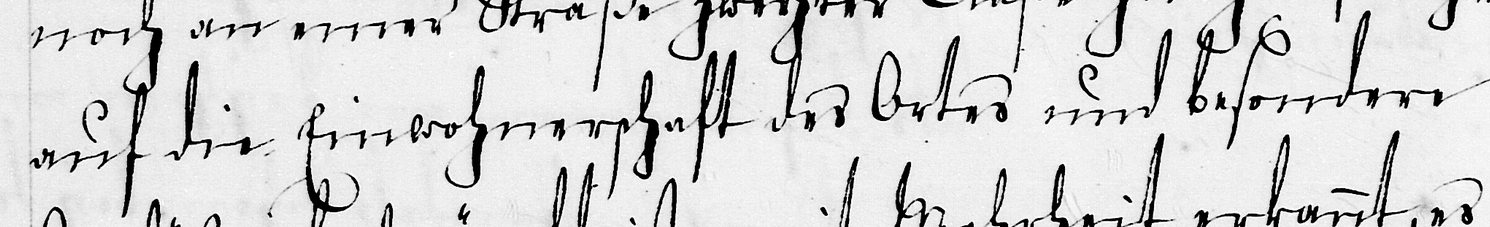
auf die Einwohnerschaft des Ortes und besondere
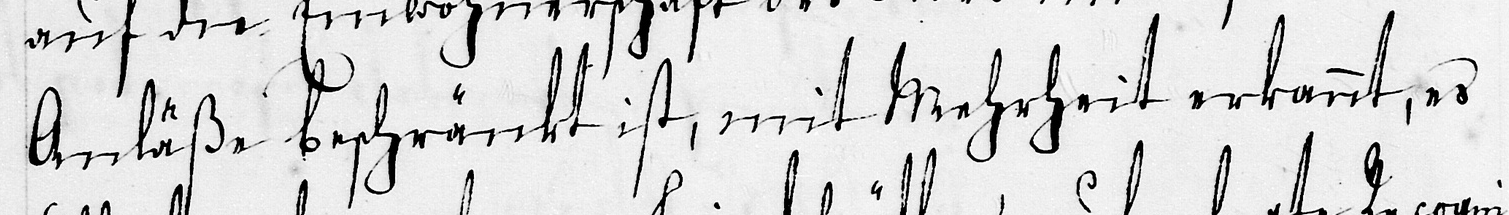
Anläße beschränkt ist, mit Mehrheit erkannt, es
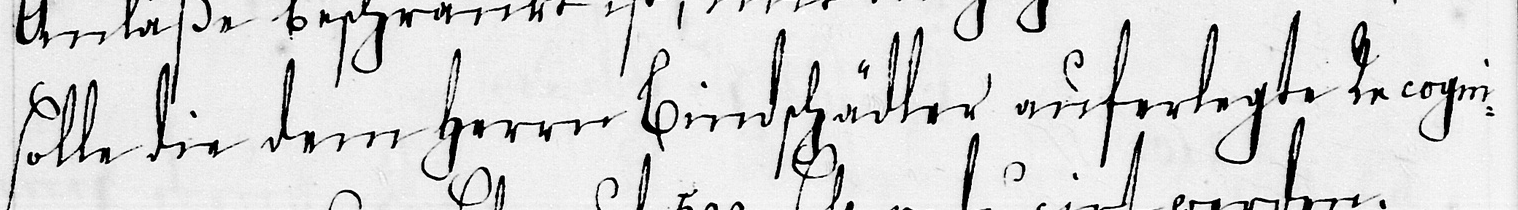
olle die dem Herrn Bindschädler auferlegte Recogn¬
